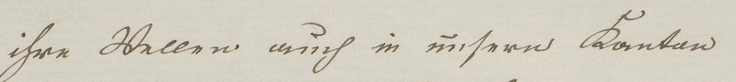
ihre Wellen auch in unsern Kanton
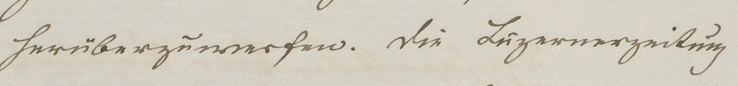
herüberzuwerfen. Die Luzernerzeitung
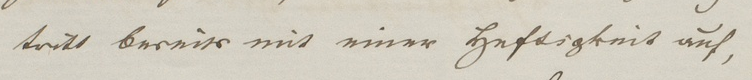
tritt bereits mit einer Heftigkeit auf,
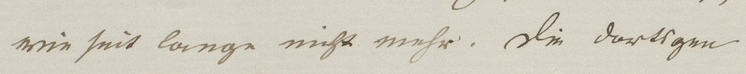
wie seit lange nicht mehr. Die dortigen
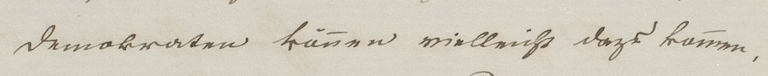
Demokraten können vielleicht dazu kommen,
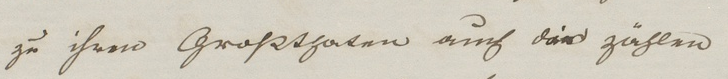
zu ihren Grossthaten auch die zählen
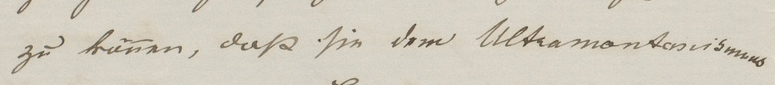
zu können, daß Sie dem Ultramontanismus
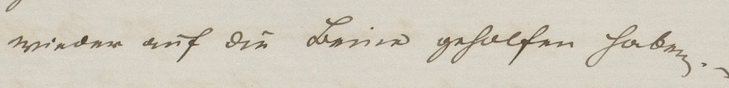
wieder auf die Beine geholfen haben. –
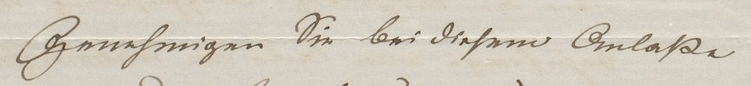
Genehmigen Sie bei diesem Anlaße
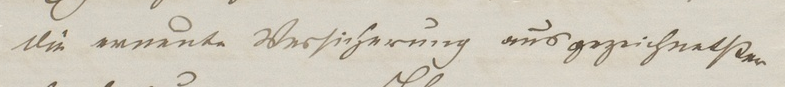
die erneute Versicherung ausgezeichnetster
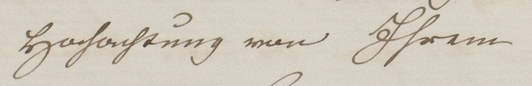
Hochachtung von Ihrem
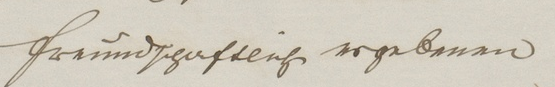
freundschaftlich ergebenen
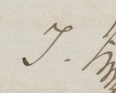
J.
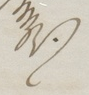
1868.
